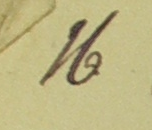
16
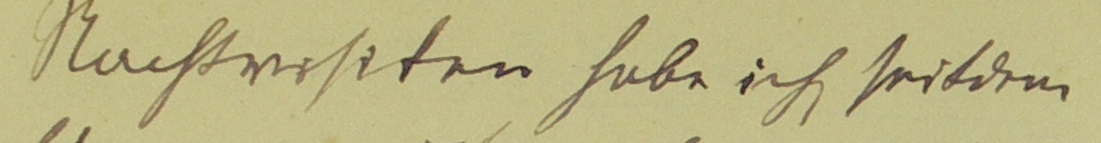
Nachtvisiten habe ich seitdem
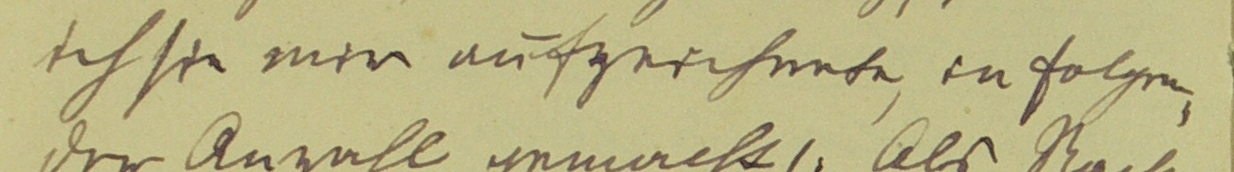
ich sie mir aufzeichnete, in folgen¬
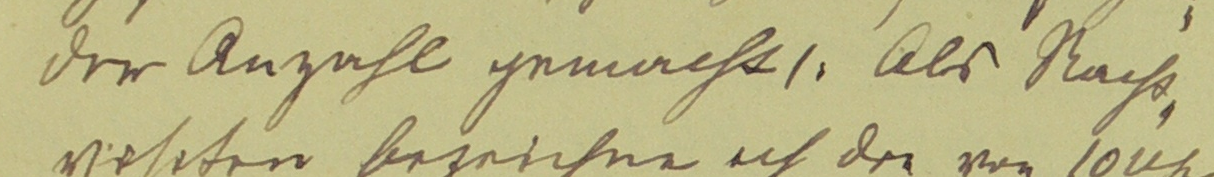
der Anzahl gemacht: Als Nacht¬
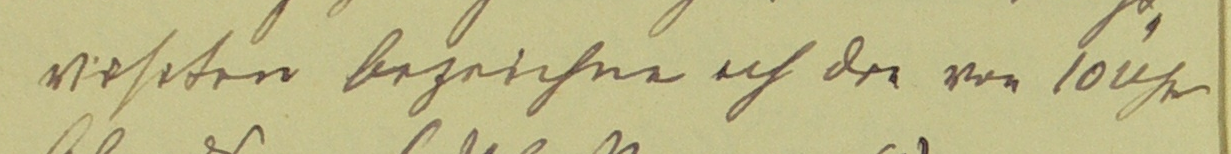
visiten bezeichne ich die von 10 Uhr
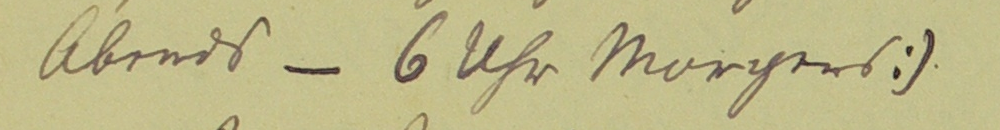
Abends – 6 Uhr Morgens:
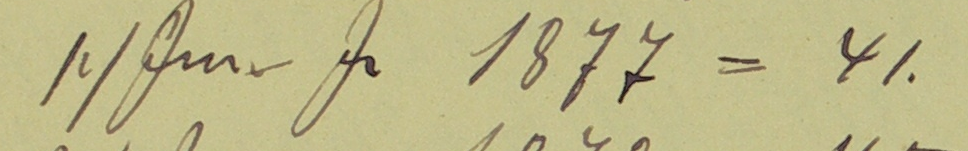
1) Im Jahr 1877 = 41
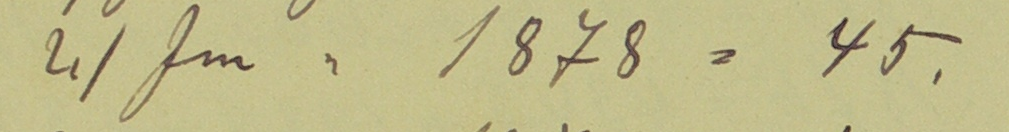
2) * 1878 = 45
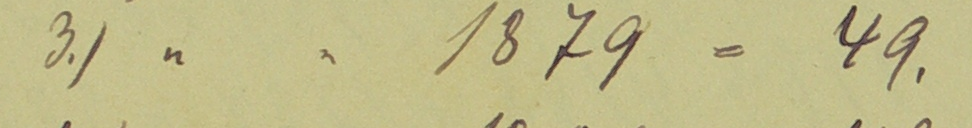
3) * 1879 = 49
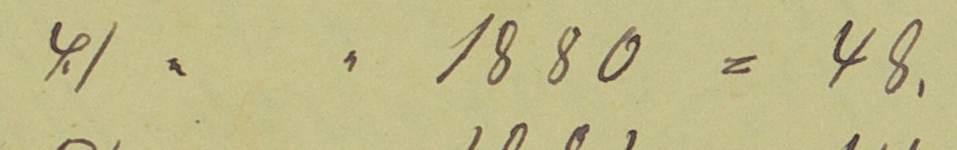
4) * 1880 = 48
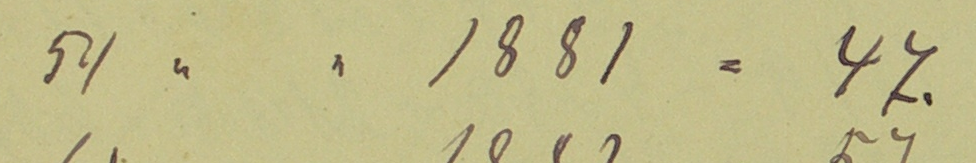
5) * 1881 = 47
